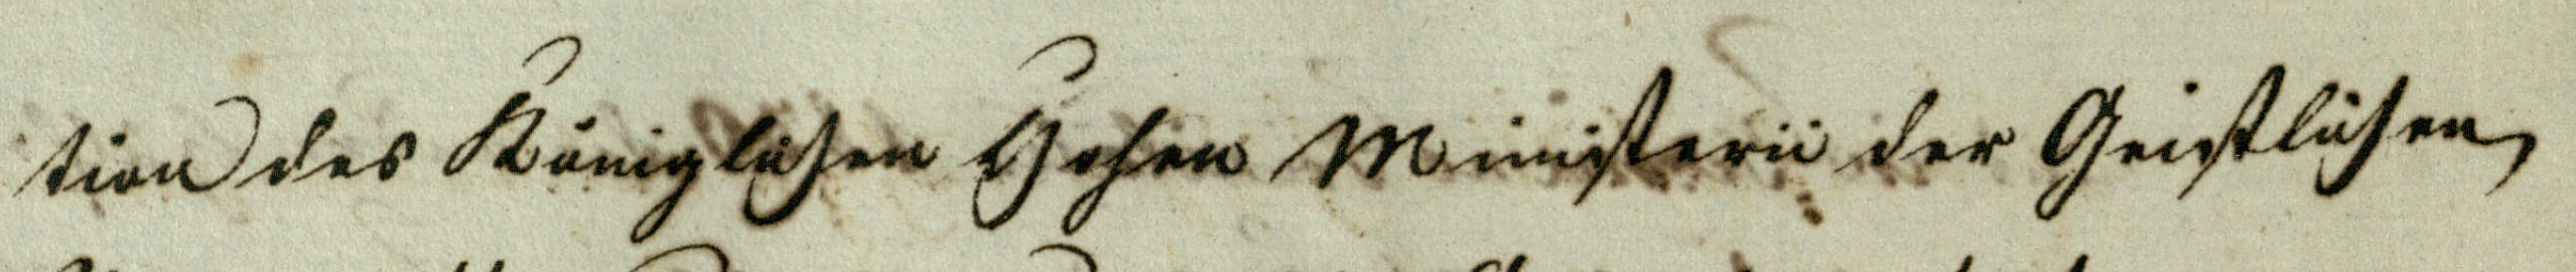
tion des Königlichen Hohen Ministerii der Geistlichen,
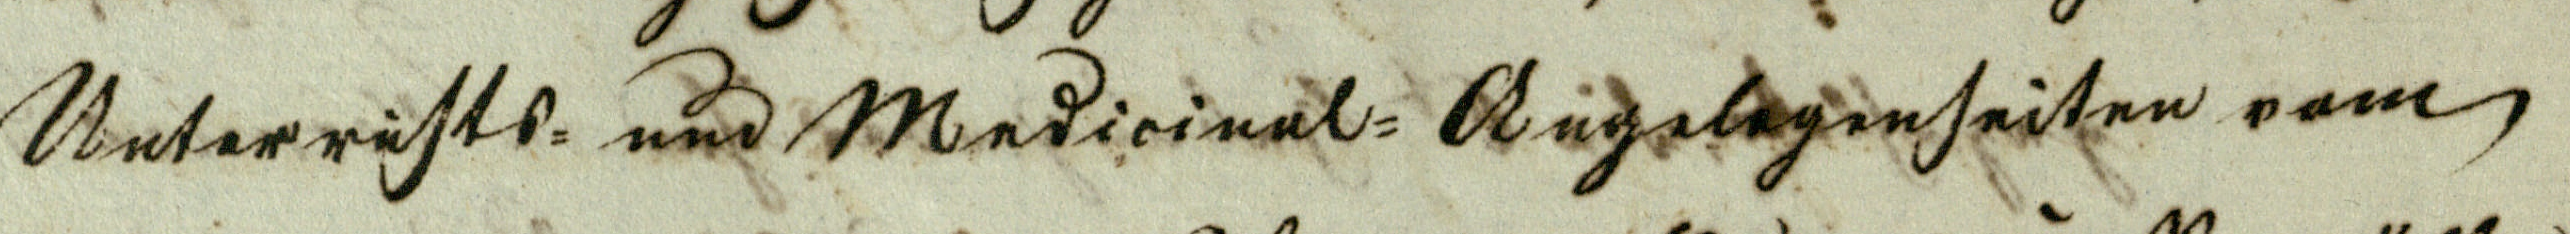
Unterrichts- und Medicinal- Angelegenheiten vom
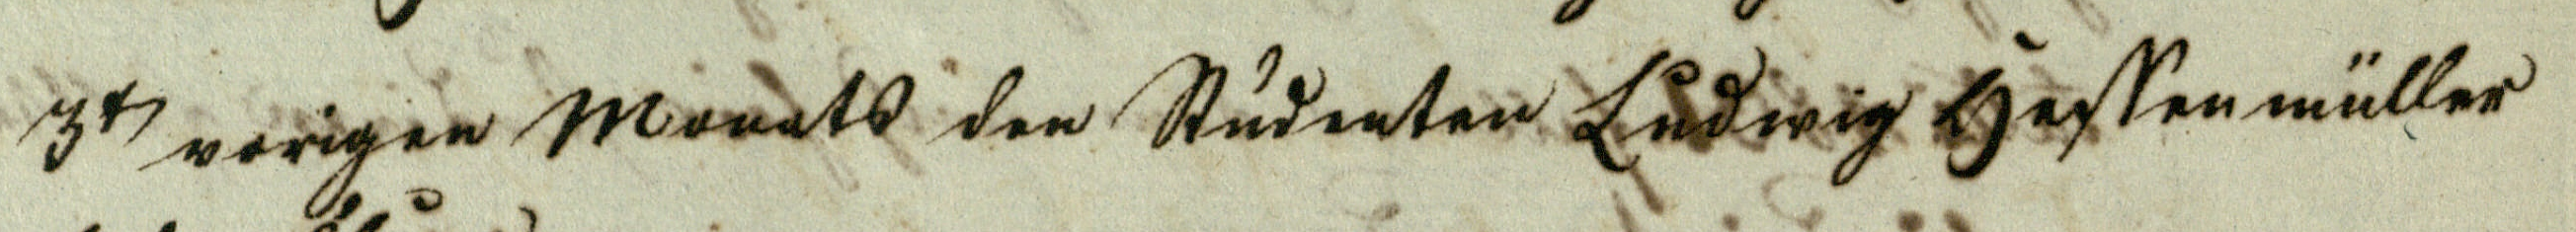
3 t vorigen Monats den Studenten Ludwig Hessenmüller
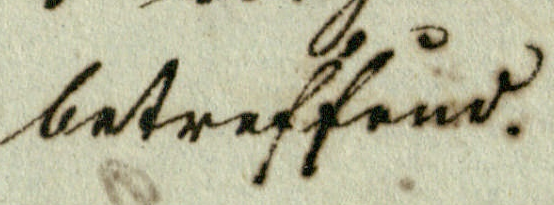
betreffend.
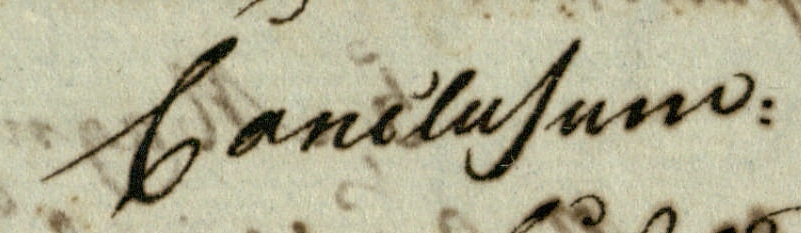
Conclusum:
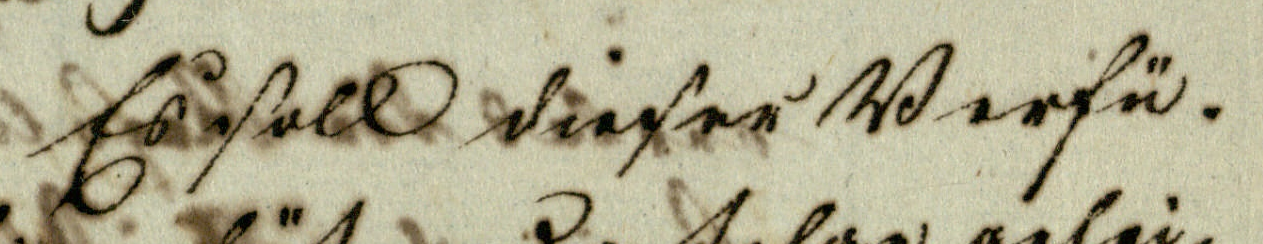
Es soll dieser Verfü¬
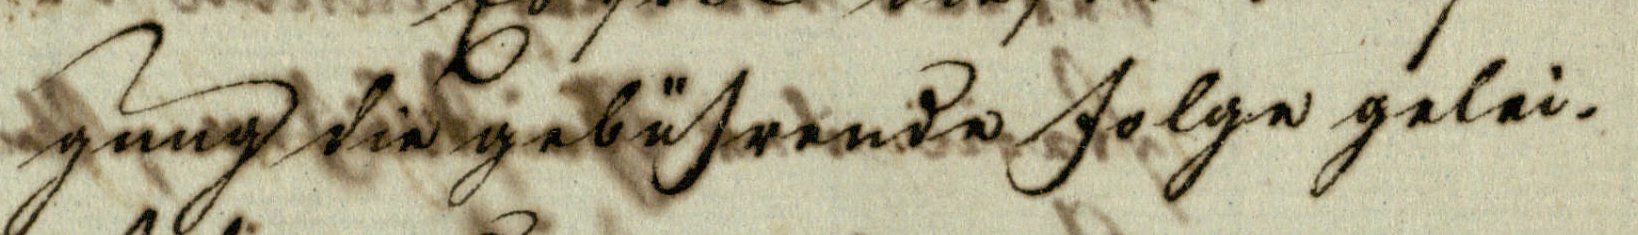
gung die gebührende Folge gelei¬
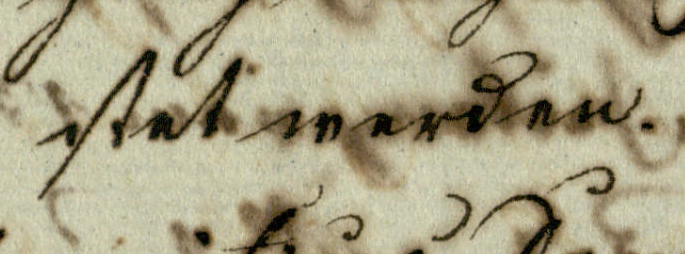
stet werden.
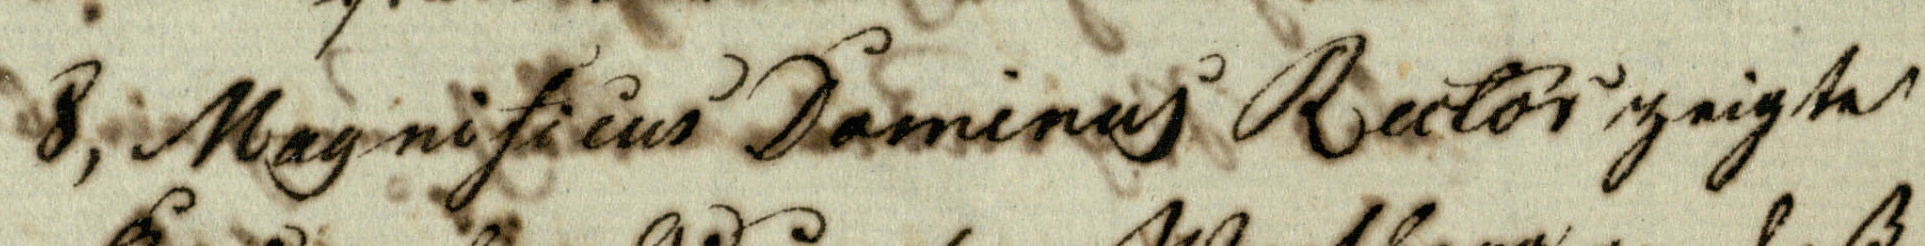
8, Magnificus Dominus Rector zeigte
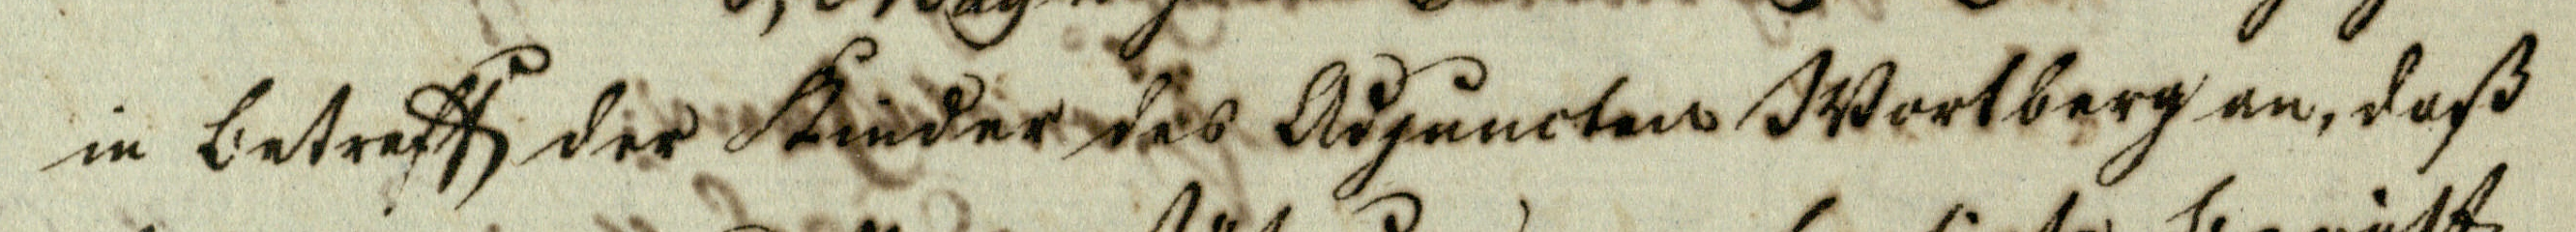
in Betreff der Kinder des Adjuncten Wortberg an, daß
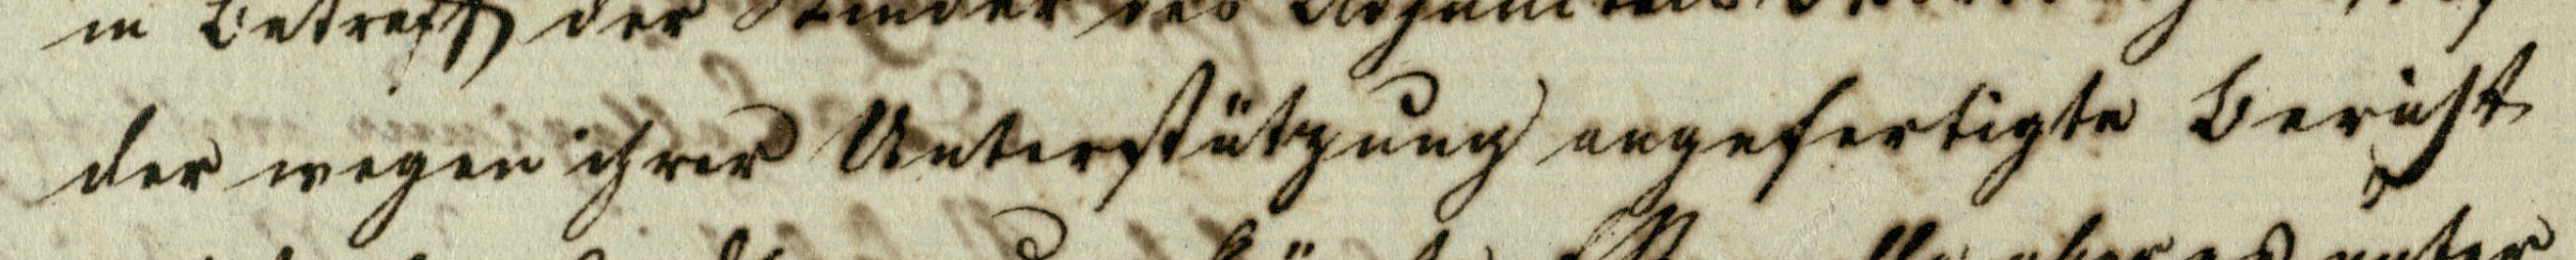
der wegen ihrer Unterstützung angefertigte Bericht
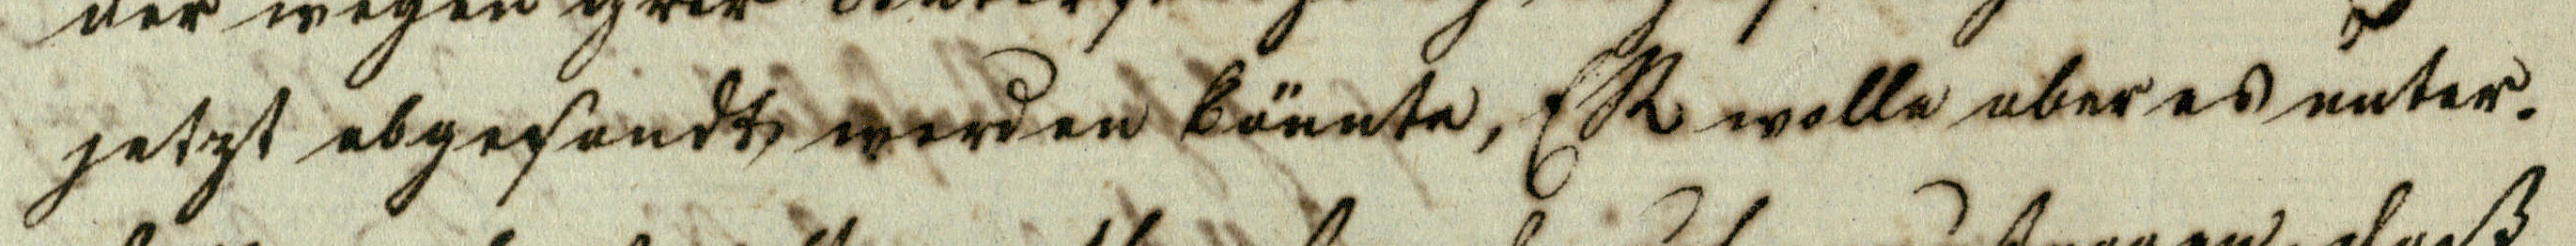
jetzt abgesandt werden könnte, ER wolle aber es unter¬
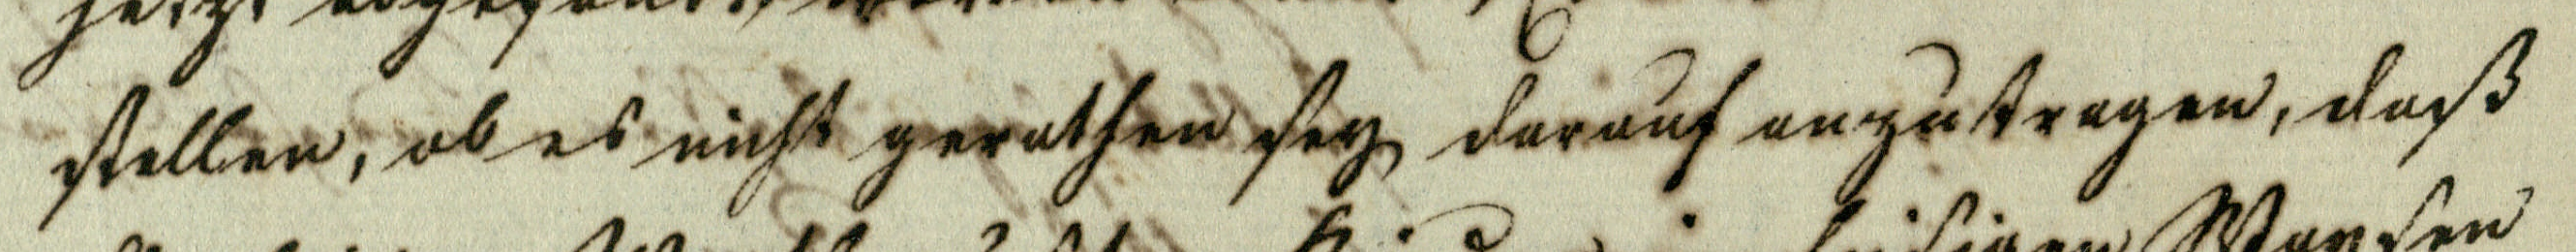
stellen, ob es nicht gerathen sey, darauf anzutragen, daß
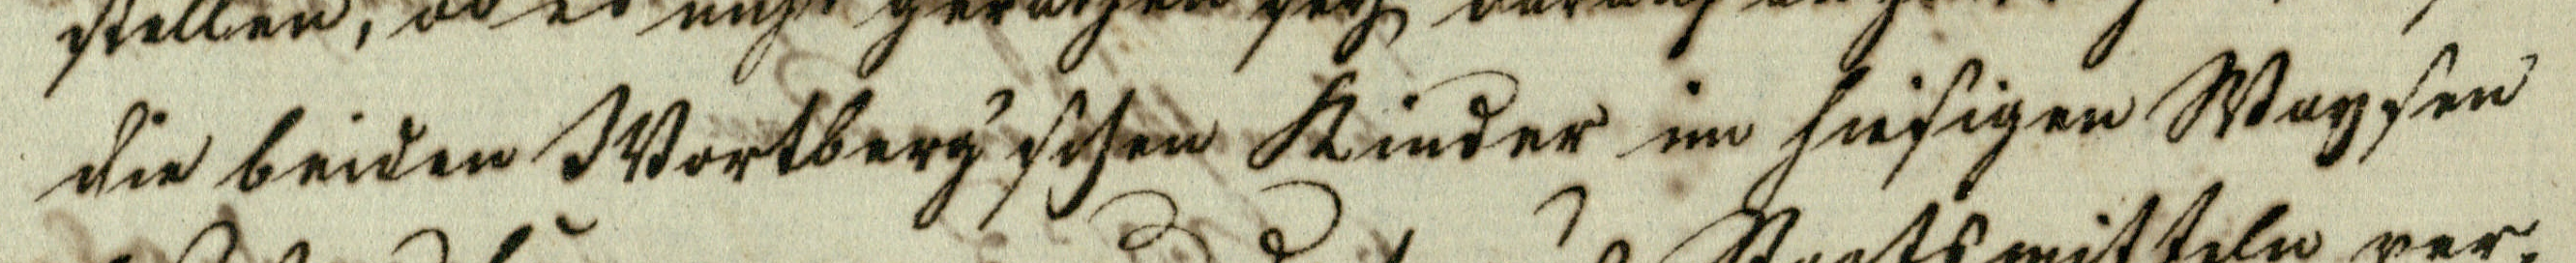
die beiden Wortberg'schen Kinder im hiesigen Waysen
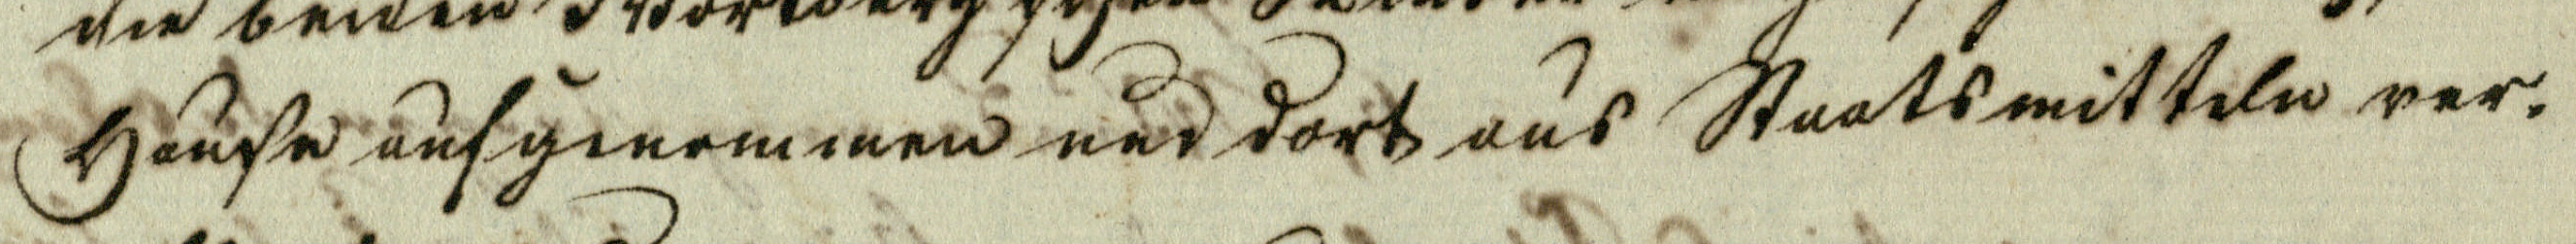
Hause aufgenommen und dort aus Staatsmitteln ver¬
